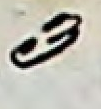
3
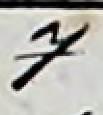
7
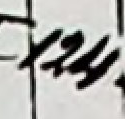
124
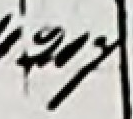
217
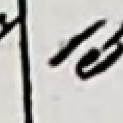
15
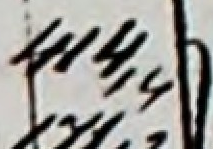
414,4
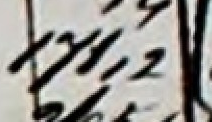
171,2
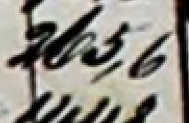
265,6
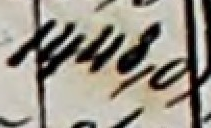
1488,0
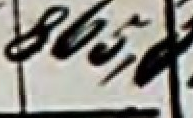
856.0
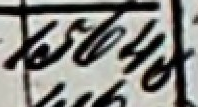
1564,8
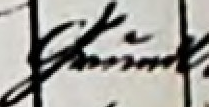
Grundt
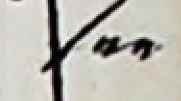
see
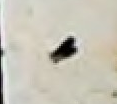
„
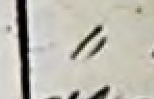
„
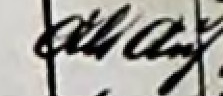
Alt Aus
